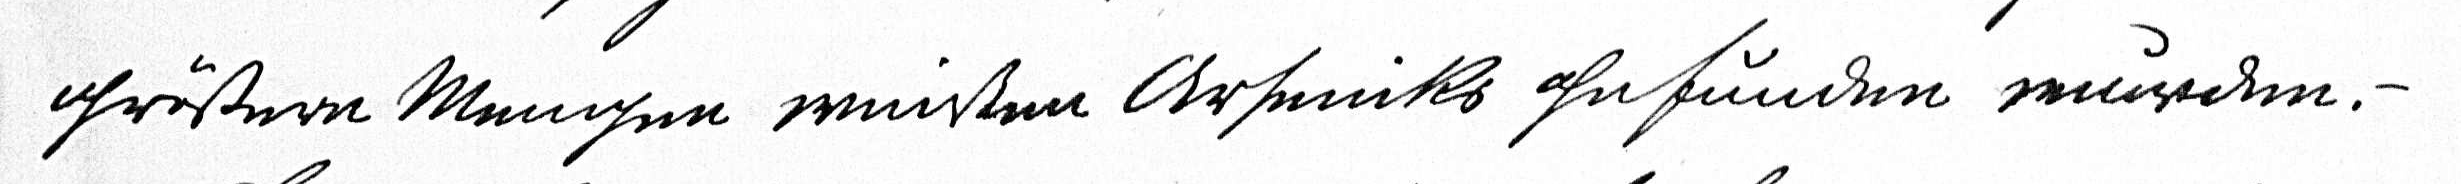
größere Mengen weißen Arseniks gefunden wurden.
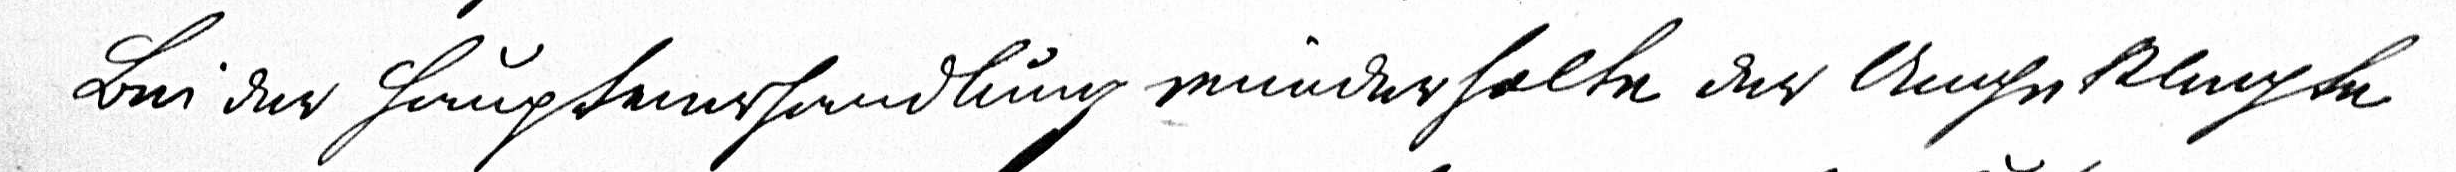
Bei der Hauptverhandlung wiederholte der Angeklagte
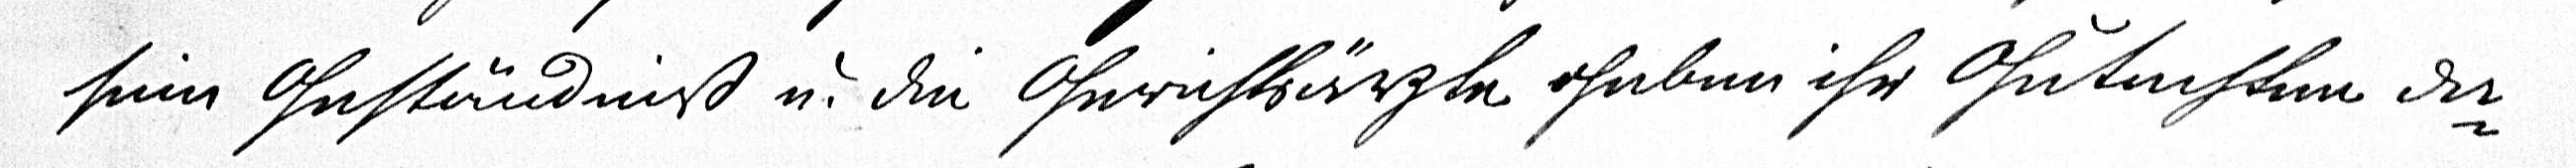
sein Geständniß u. die Gerichtsärzte geben ihr Gutachten da¬
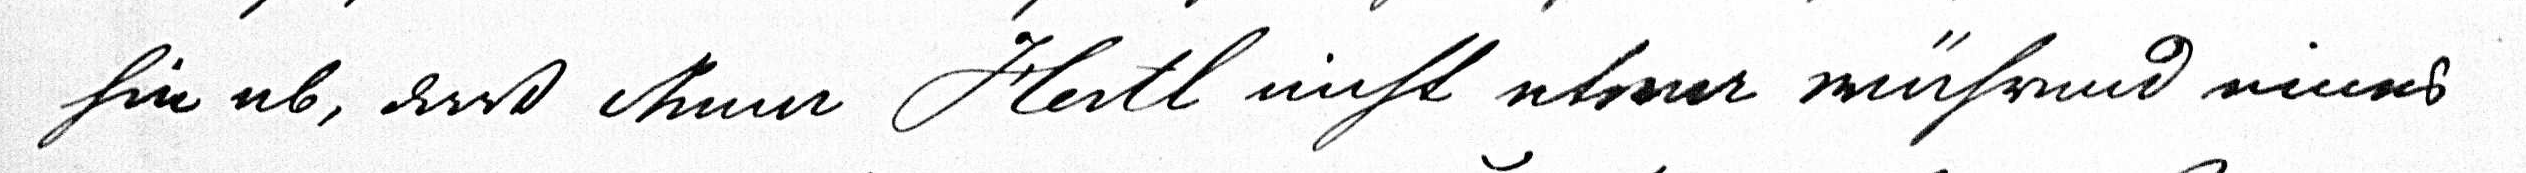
hin ab, daß Anna Hertl nicht etwa während eines
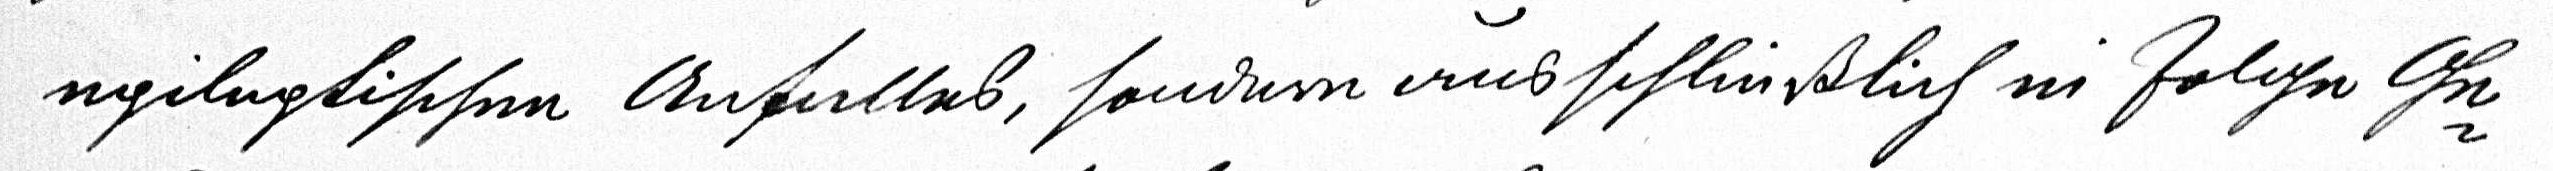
epileptischen Anhaltes, sondern ausschließlich in Folge Ge¬
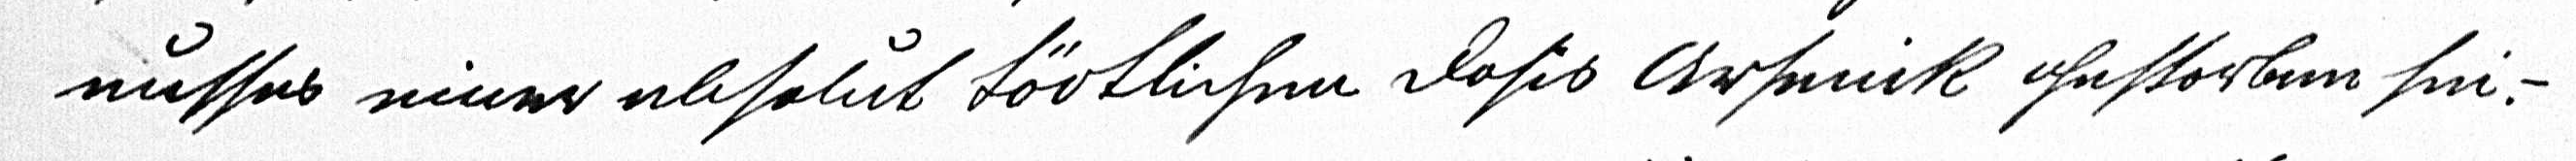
nusses einer absolut tödtlichen Dosis Arsenik gestorben hin.
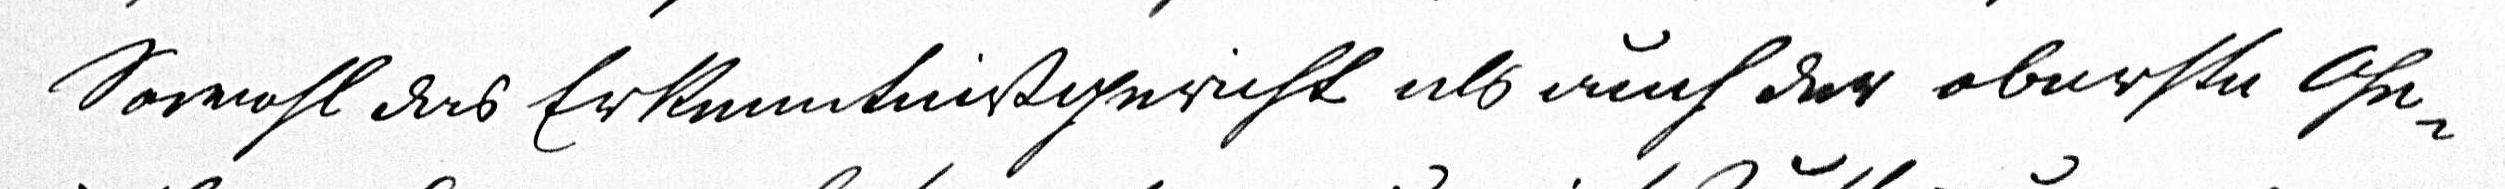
Sowohl das Erkenntnißgericht als auch der oberste Ge¬
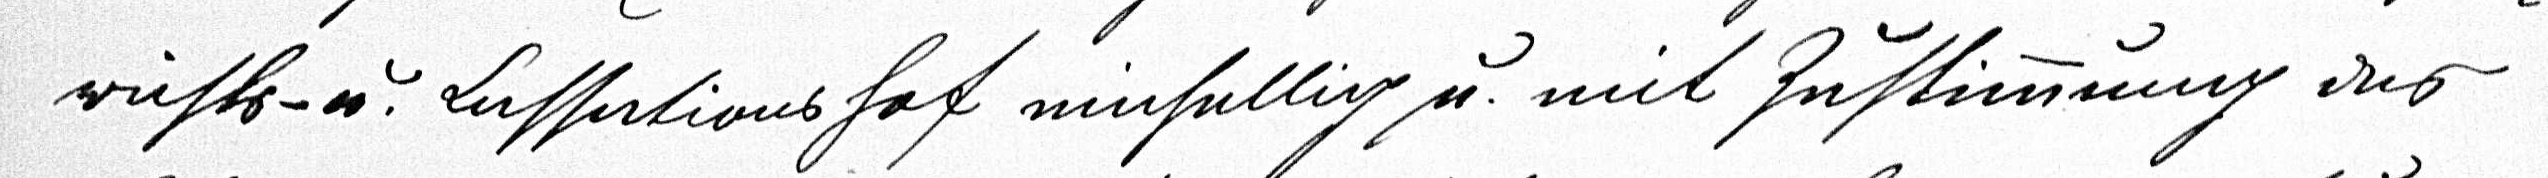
richts- u. Cassationshof einhellig u. mit Zustimmung des
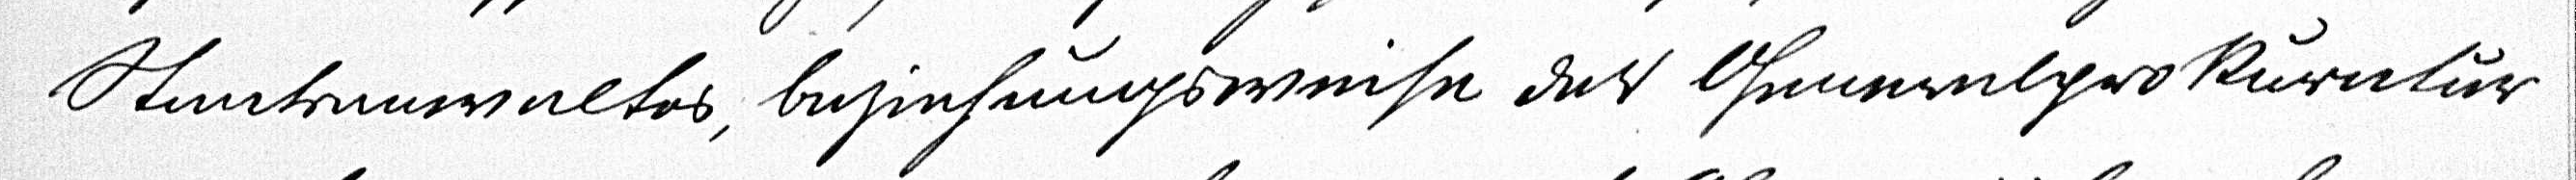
Staatsanwaltes, beziehungsweise der Generalprokuratur
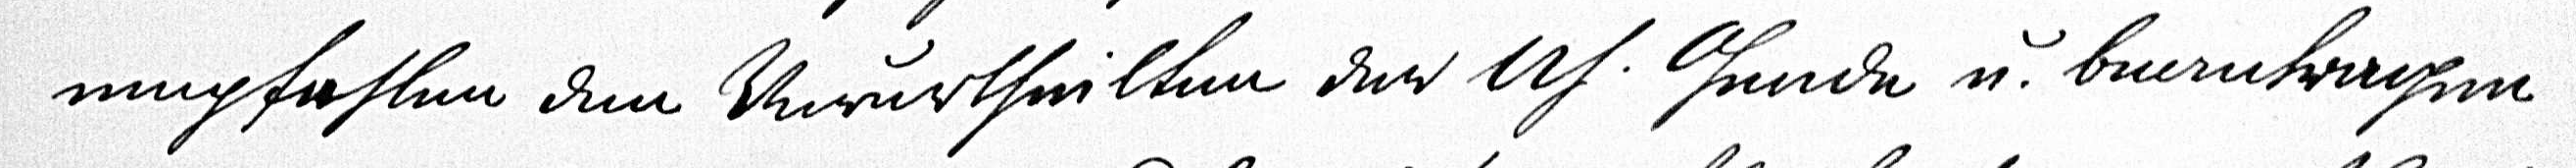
empfehlen den Verurtheilten der Ah. Gnade u. beantragen
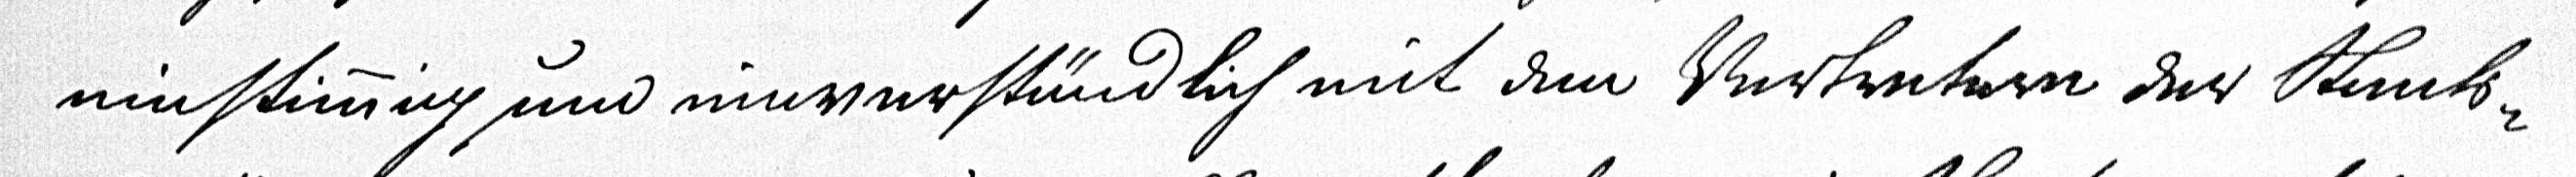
einstimmig und einverständlich mit den Vertretern der Staats¬
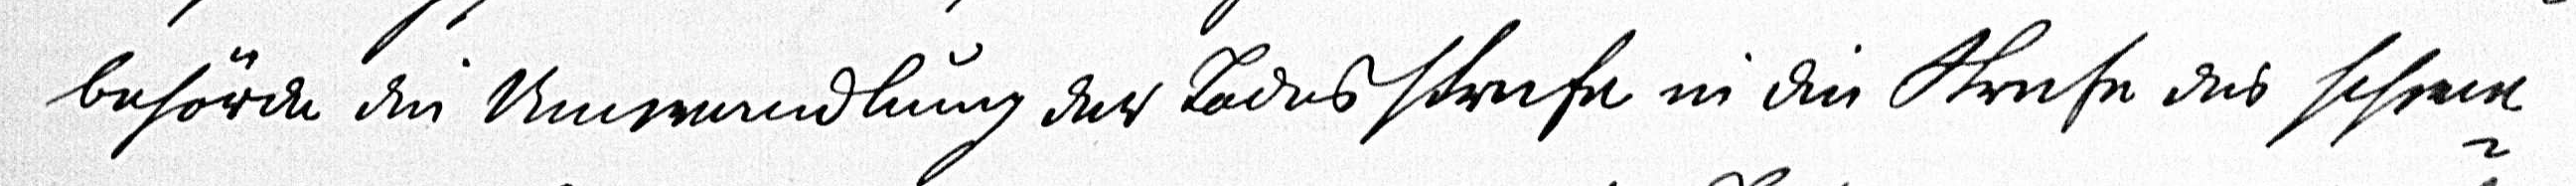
behörde die Umwandlung der Todesstrafe in die Strafe des schwe¬
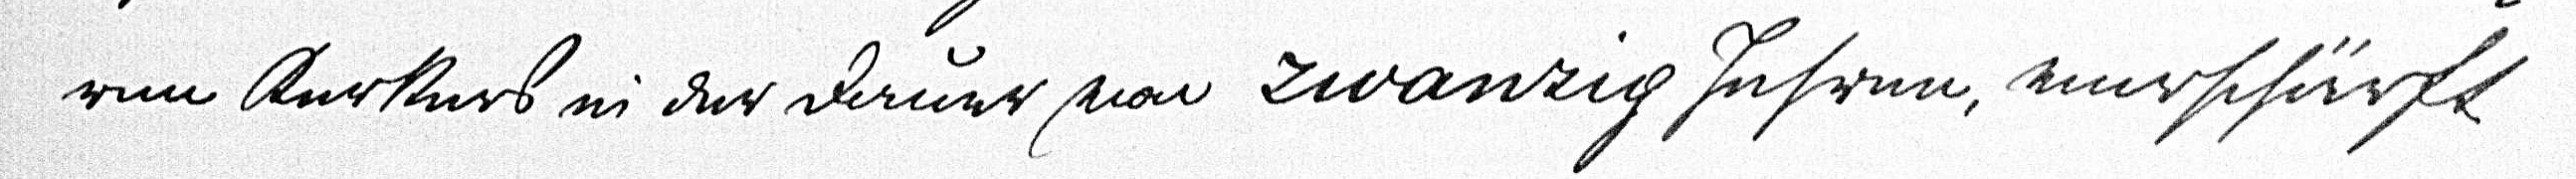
ren Kerkers in der Dauer von zwanzig Jahren, verschärft
